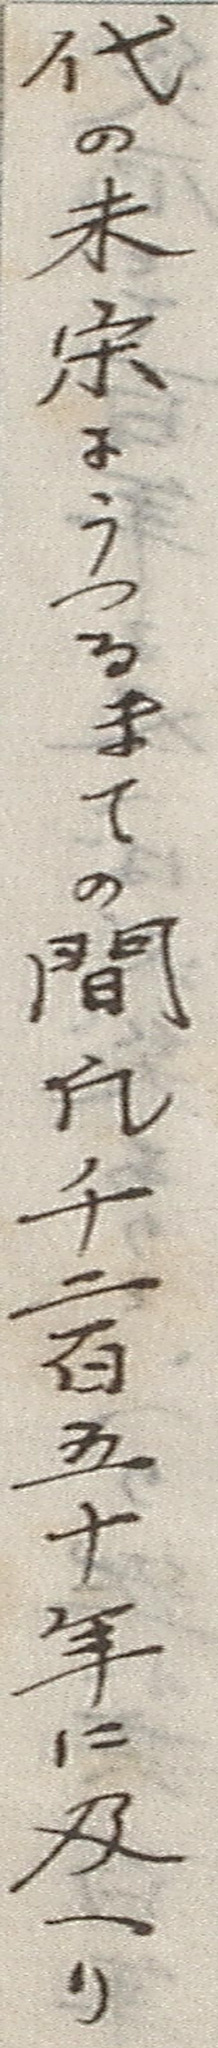代の未宋にうつるまての間凡千二百五十年に及へり
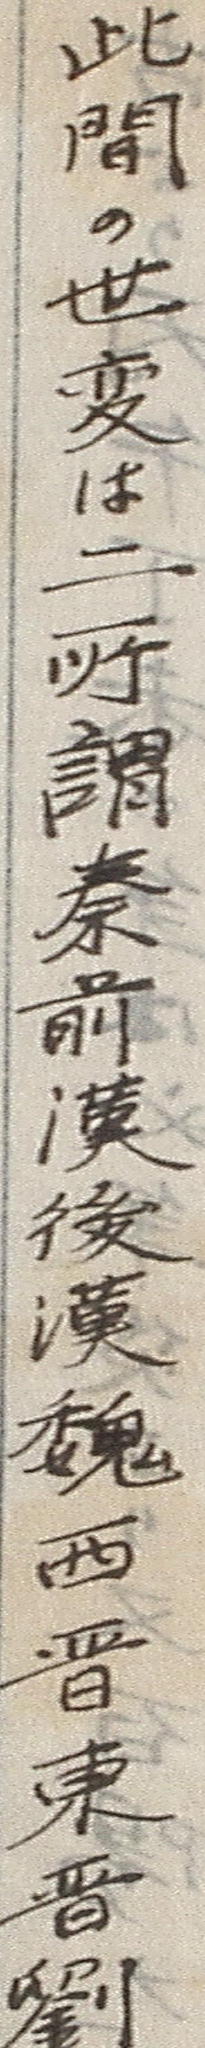此の間の世変は二所謂秦前漢後漢魏西晋東晋劉
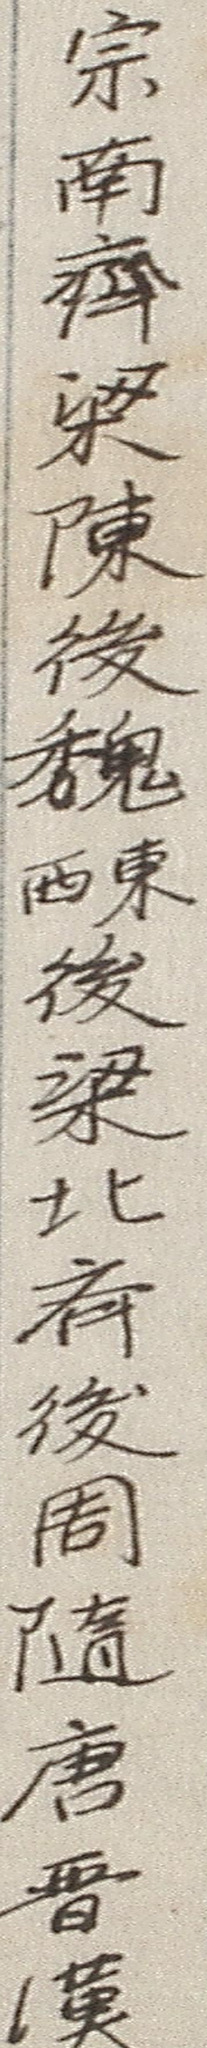宗南斉梁陣後魏東西後梁北斉後周随唐晋漢
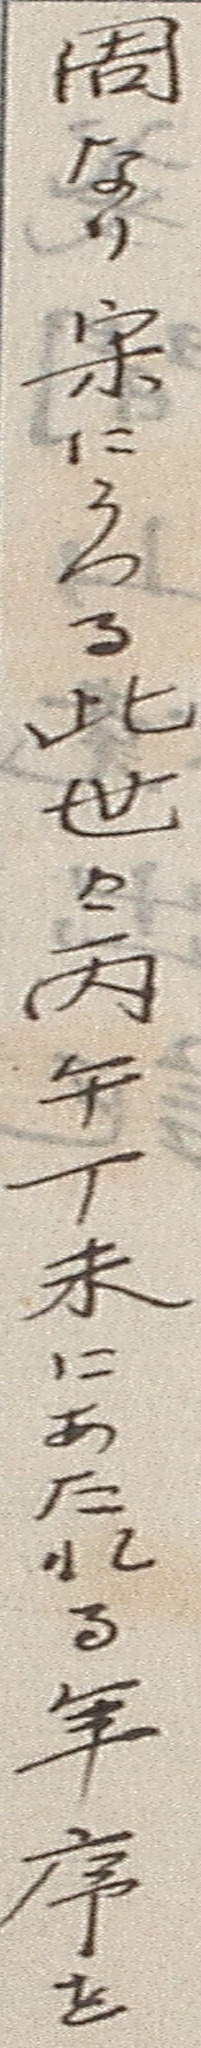周なり宋にうつる北世に丙午丁未にあたれる年序を
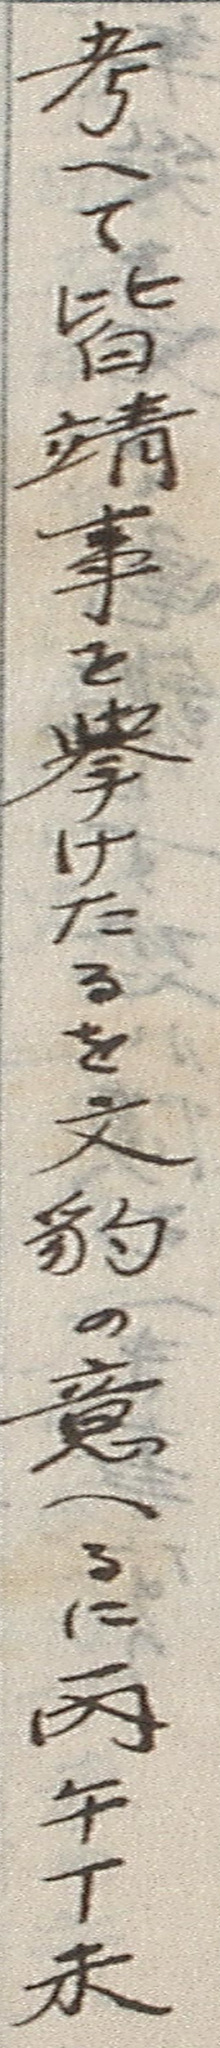考へて皆靖事を擧けたるを文豹の意へるに丙午丁未
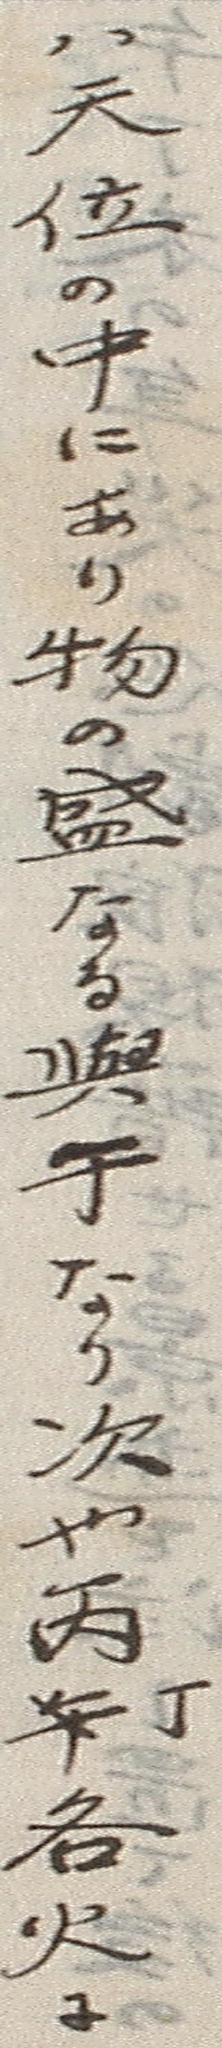ハ天位の中にあり物の盛なる與干なり次や丙午各火に
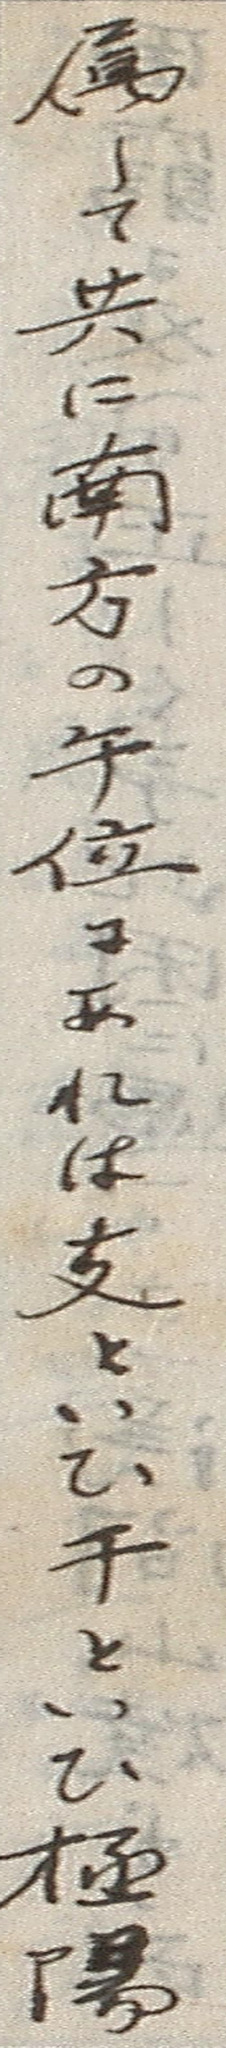属して共に南方の午位にあれは支といひ干といひ極陽
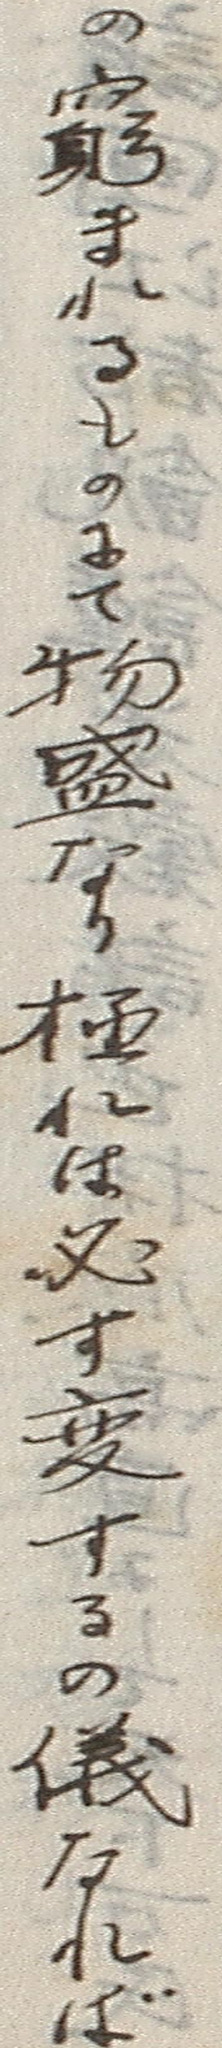の窮まれるものにて物盛なり極れは必す変するの儀なれば
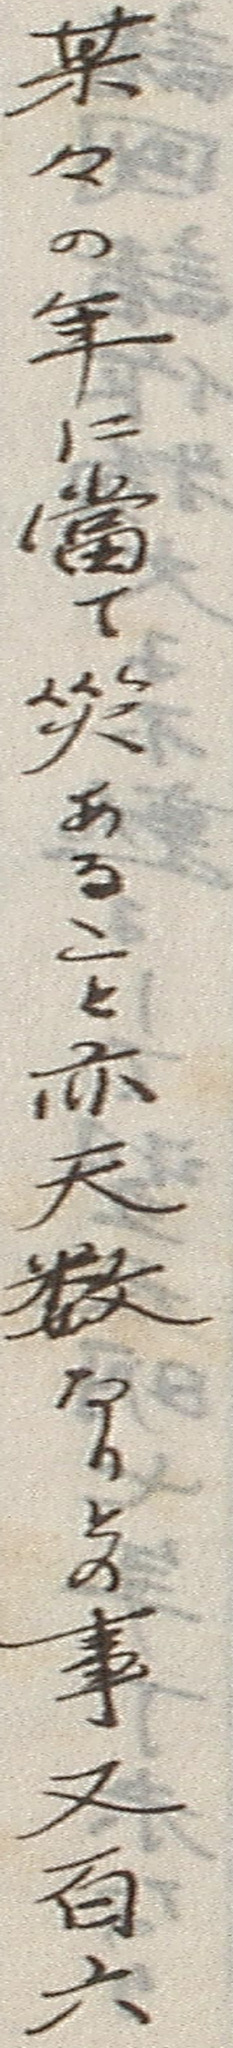某々の年に當て災あること亦天数なりとの事又百六
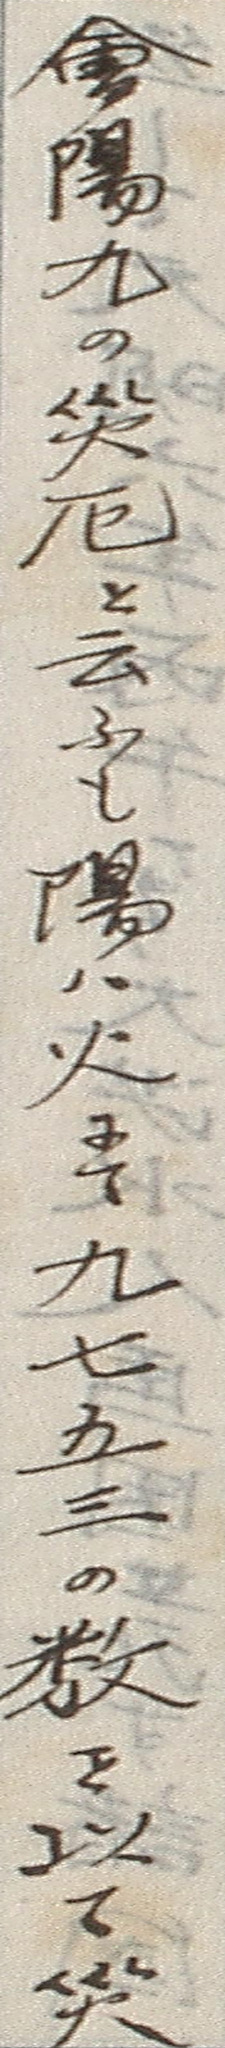會陽九の災厄と云ふも陽は火にて九七五三の数を以て災
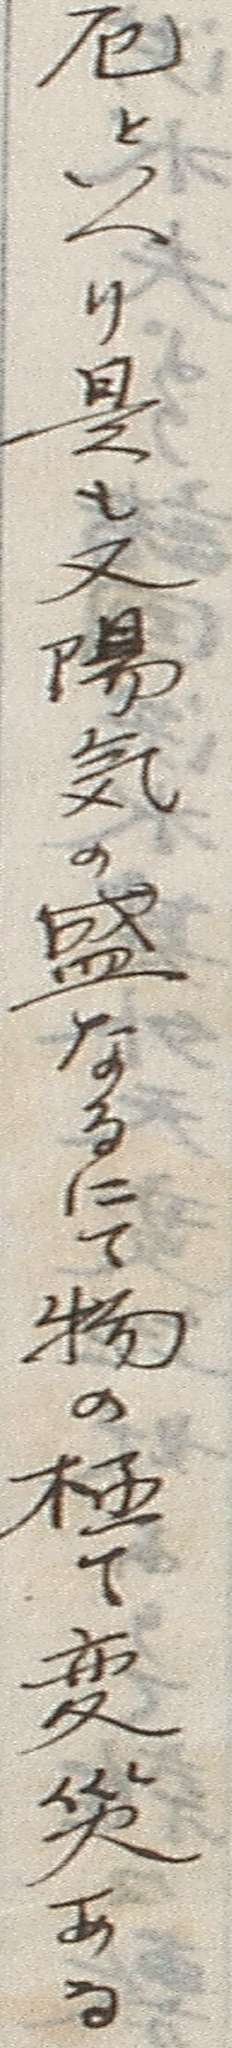厄といへり是も又陽気の盛なるにて物の極て変災ある
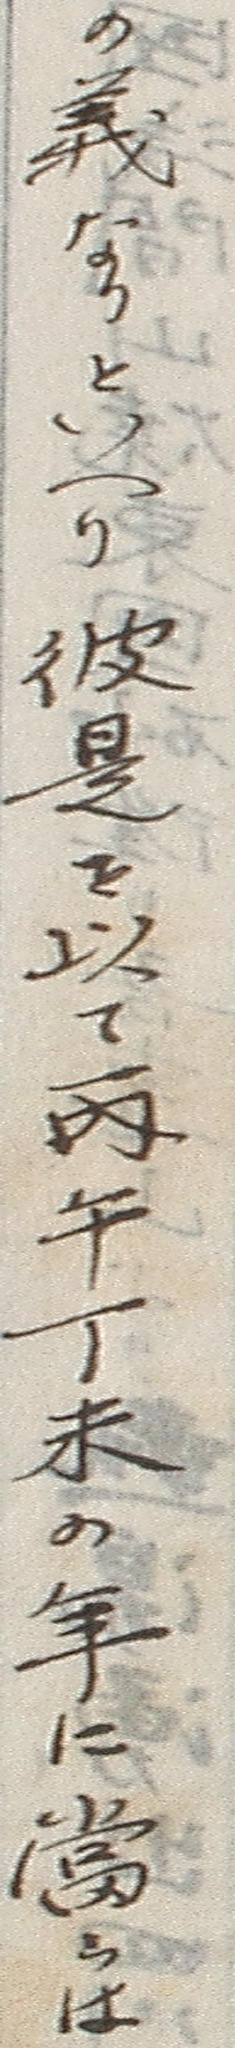の義なりといへり彼是を以て丙午丁未の年に當らは
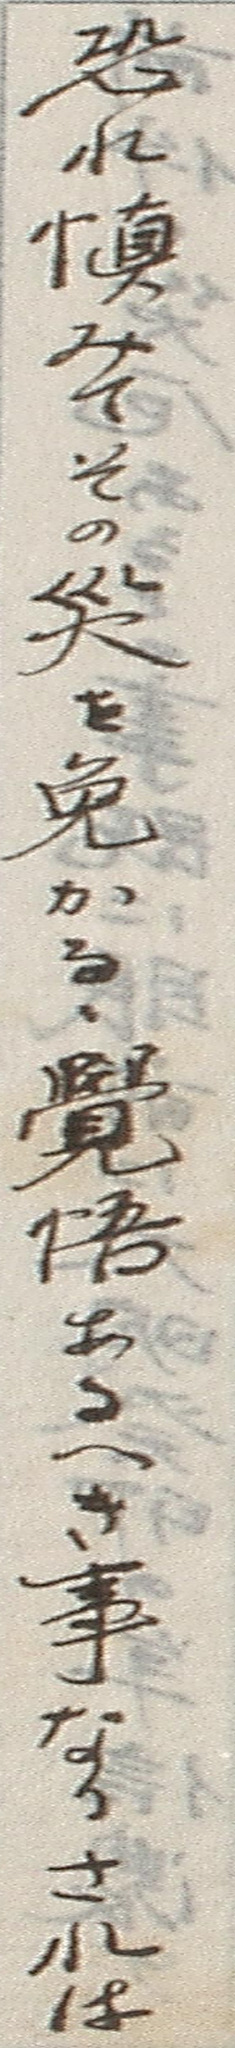恐れ慎みてその災を免かるゝ覚悟あるへき事なりされは
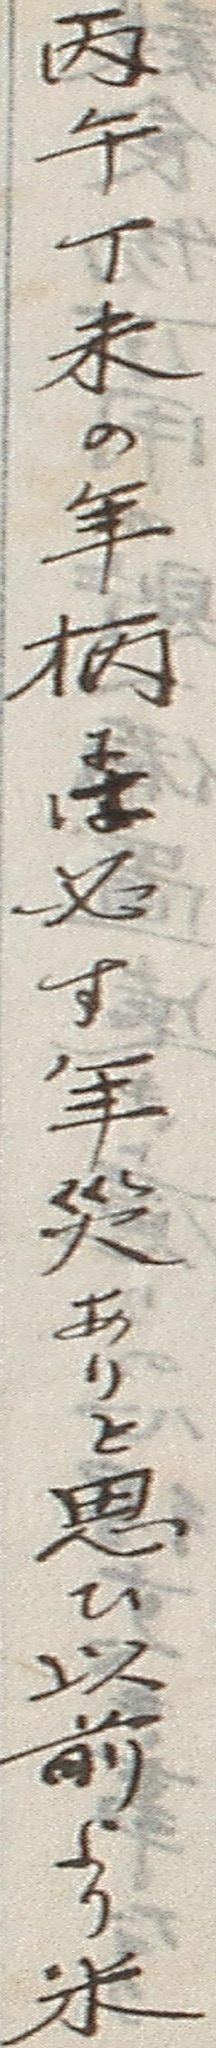丙午丁未の年柄には必す年災ありと思ひ以前より米

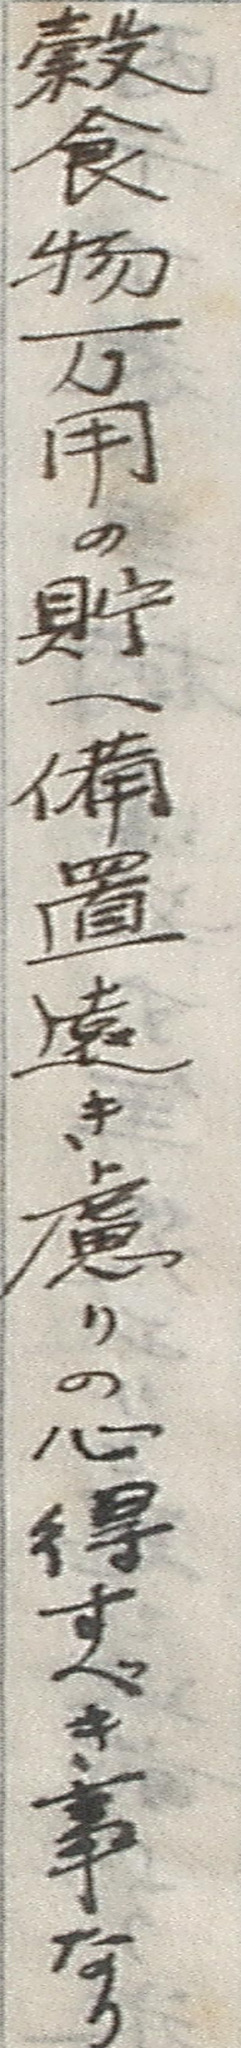穀食物万用の貯へ備置遠き慮りの心得すべき事なり
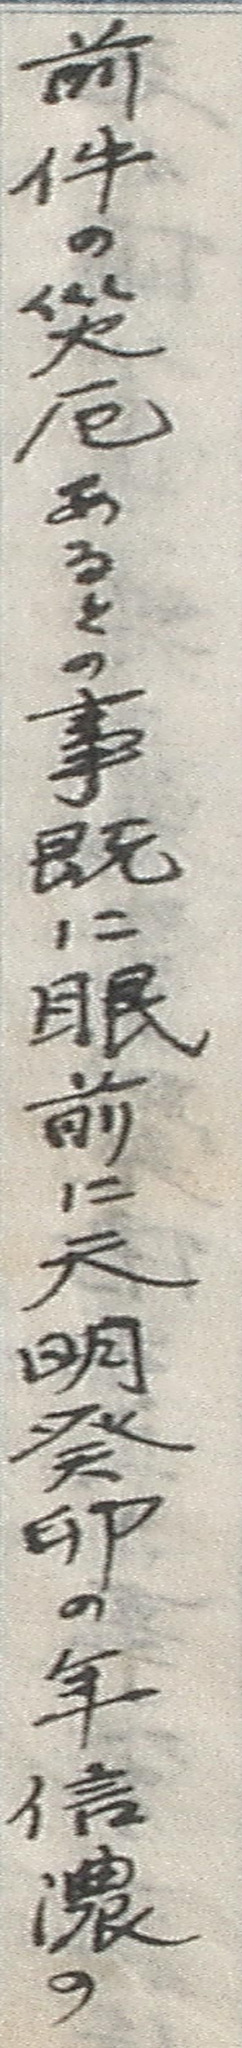前件の災厄あるとの事既に眼前に天明癸卯の年信濃の
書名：浅間山焼出記
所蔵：東京大学地震研究所図書室 Earthquake Research Institute Library, The University of Tokyo, JAPAN
